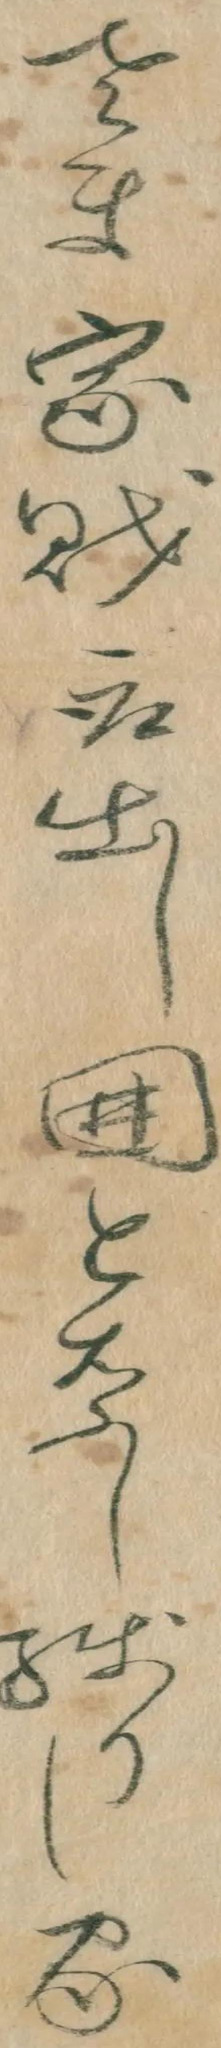さま家財取出し囲となし残りし家
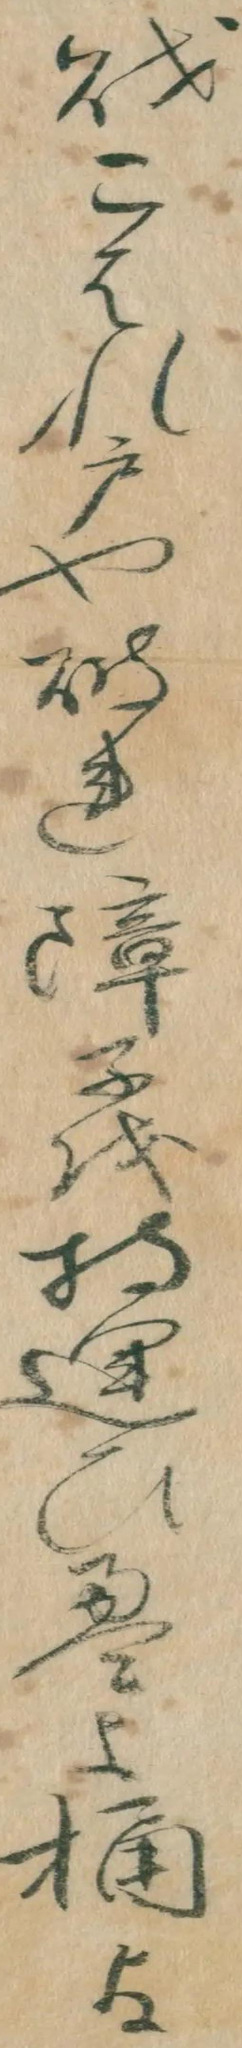財こはれ戸や破れ障子を持運ひ畳よ桶よ
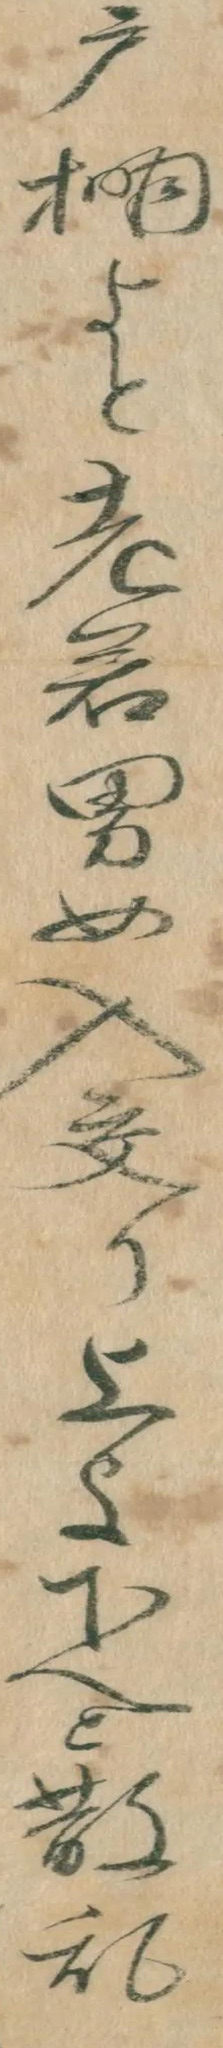戸棚よと老若男女入交り上よ下へと散乱し
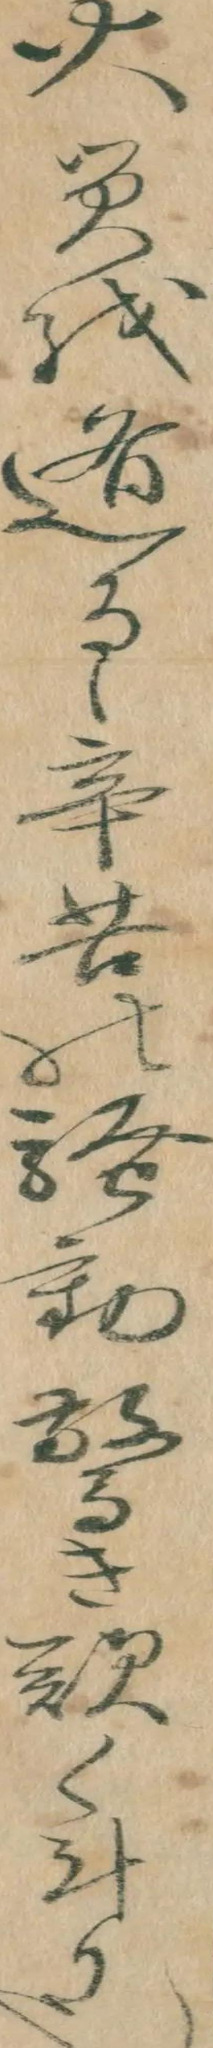火災を遁るゝ辛苦の騒動驚き歎く計り也

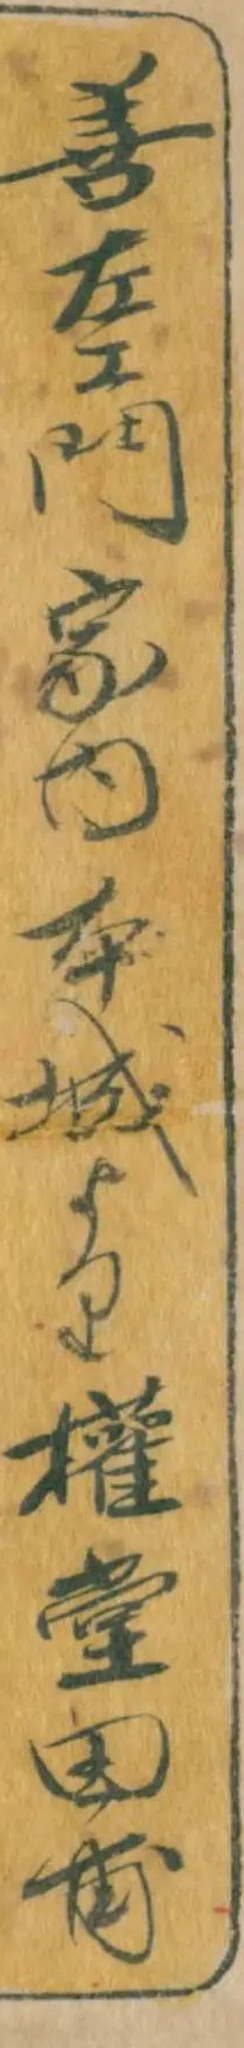善左ヱ門家内本城より権堂田甫
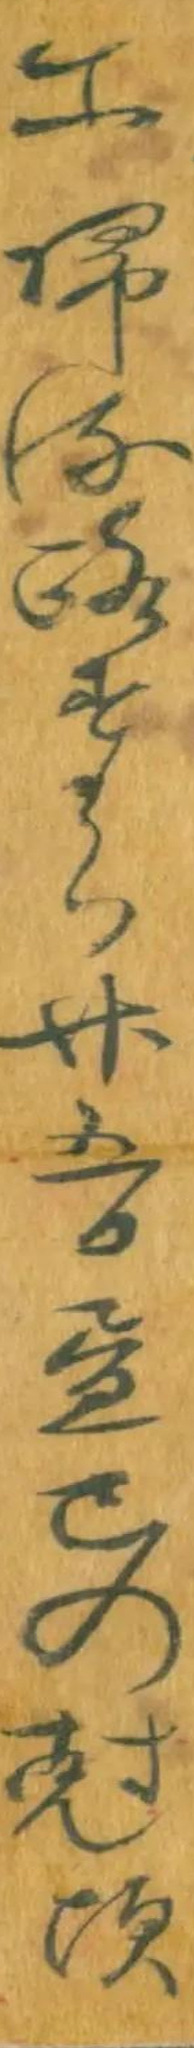に帰る路すから廿五日昼巳の尅頃
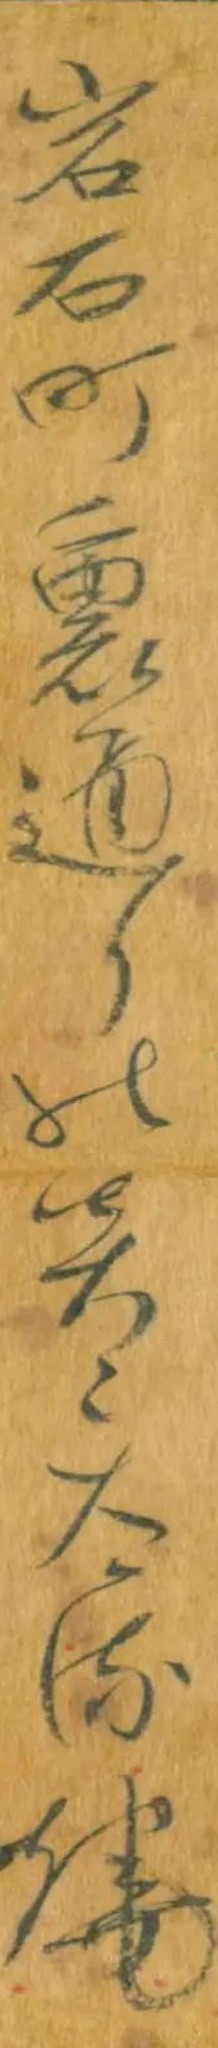岩石街裏通りの炎〻たる焼
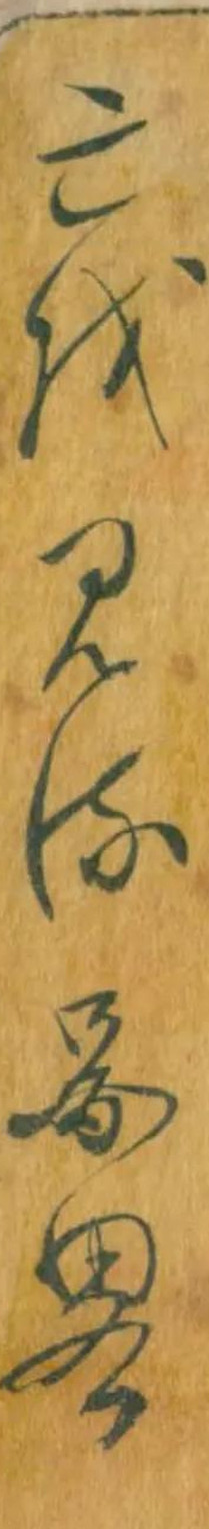亡を見る図略

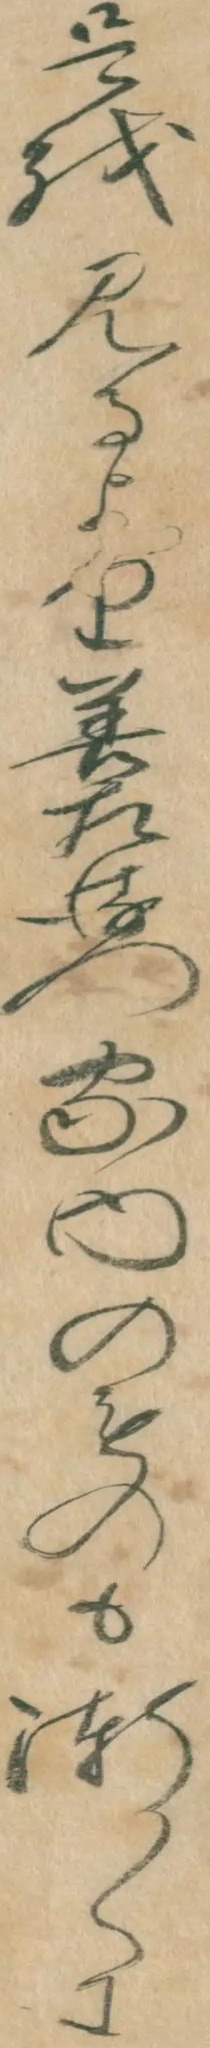是を見るより善左衛門家内のものも漸〳〵に
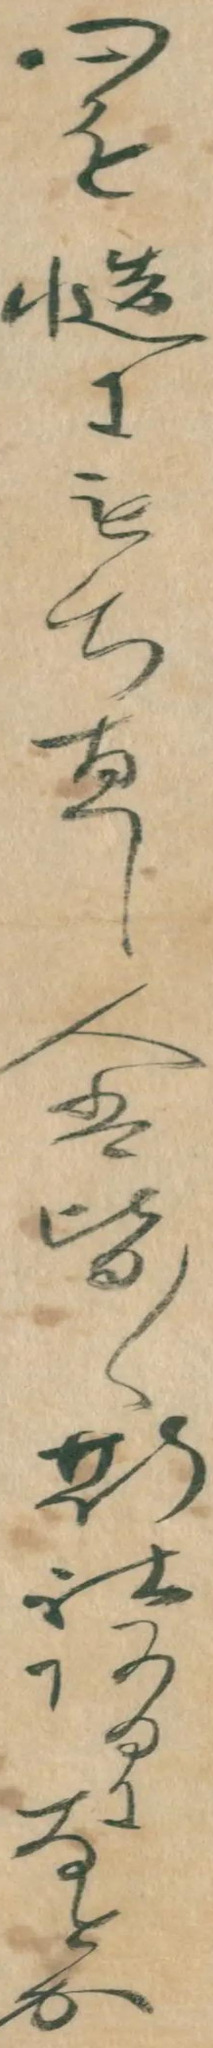心を慥にもち直し人は皆〳〵斯社あるになとか
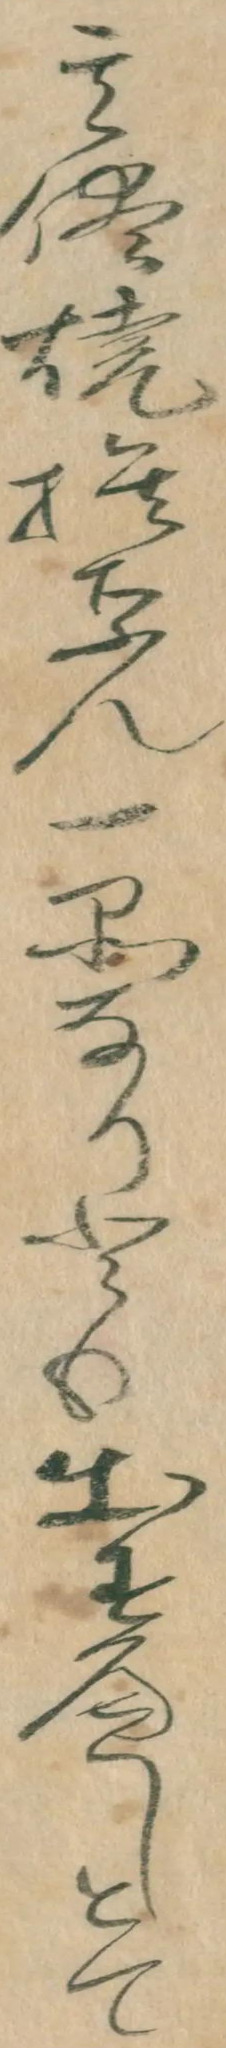其侭焼捨なん一品なりとも出すへしとて
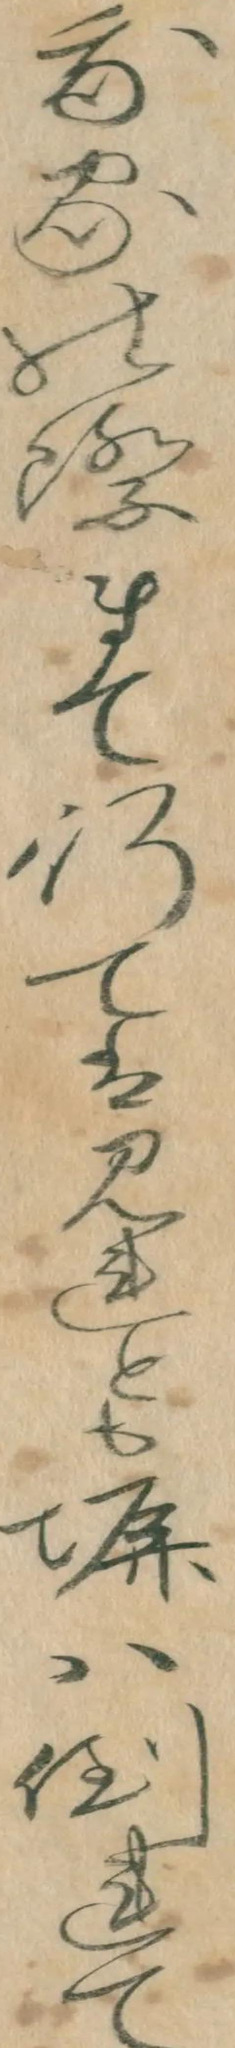我家の際まて行ては見れとも塀は倒れて
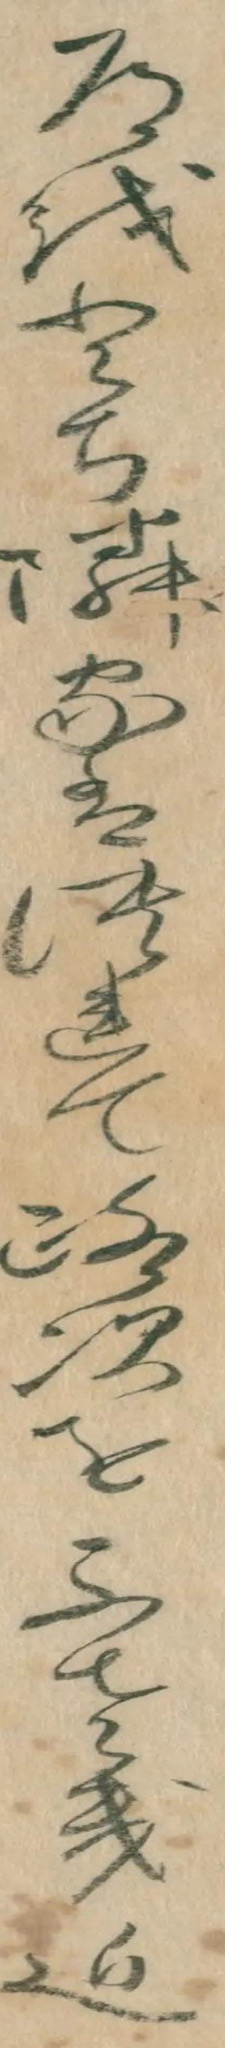道をとち隣家は潰れて路次をふさき近
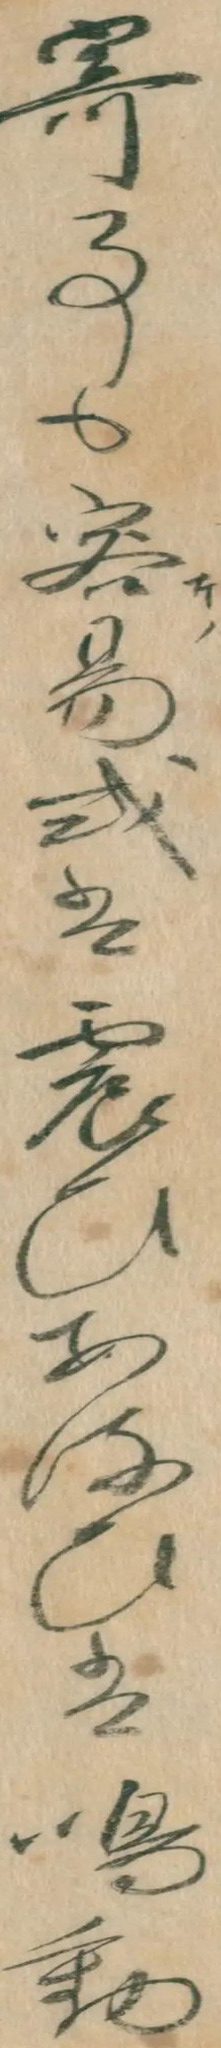寄事も容易或は震ひあるひは鳴動
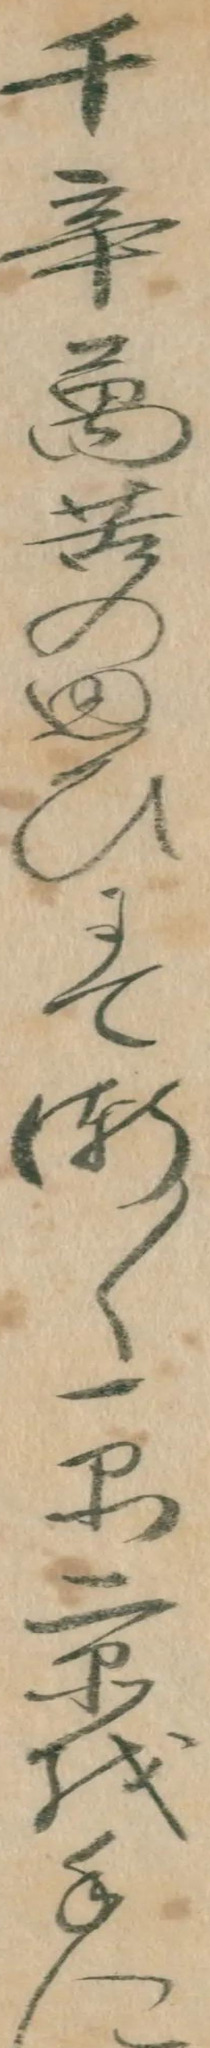千辛万苦の思ひにて漸〳〵一品二品を手に
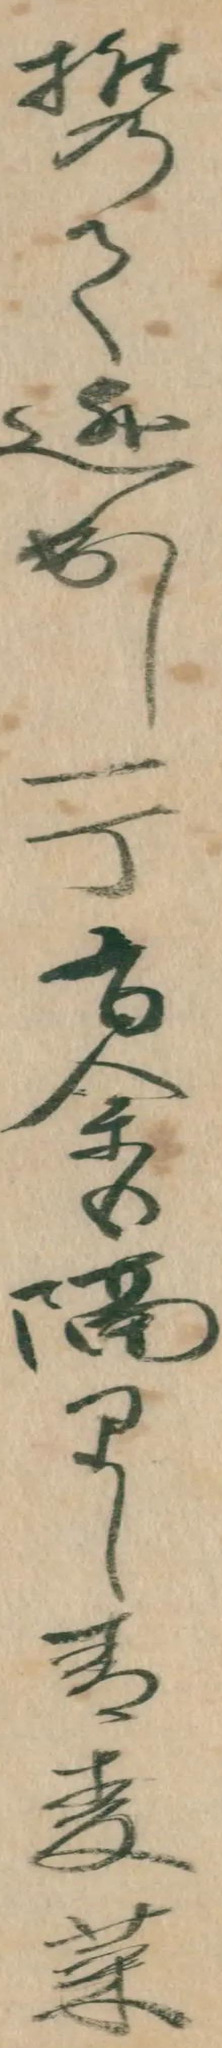携て逃出し一丁有余も隔りし青麦菜
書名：俗語之種. [4]
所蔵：国立国会図書館 National Diet Library, JAPAN
